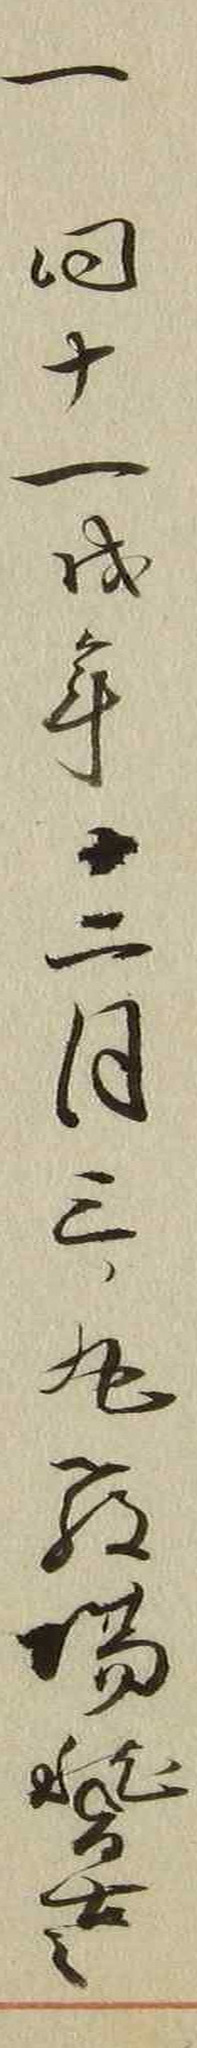一同十一戌年十二月三ノ丸教場稽古之
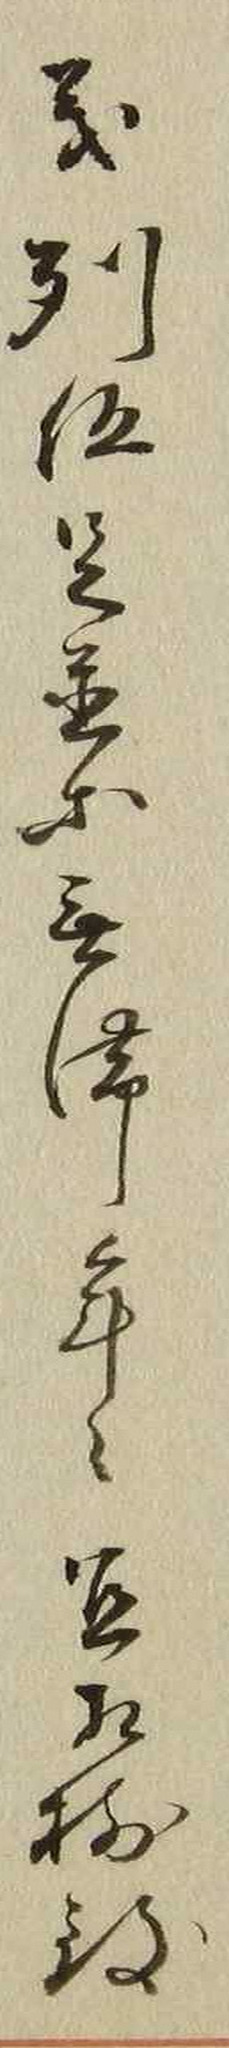義列伍足並等無滞年々宜相揃致
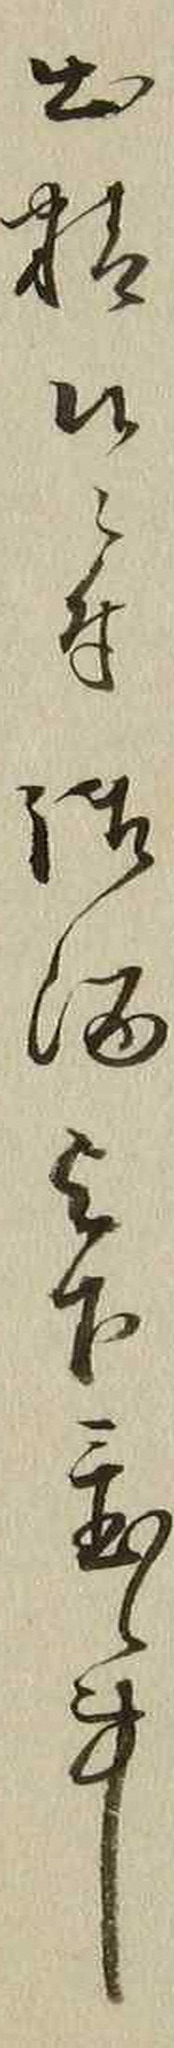出精候ニ付御酒被下置候事
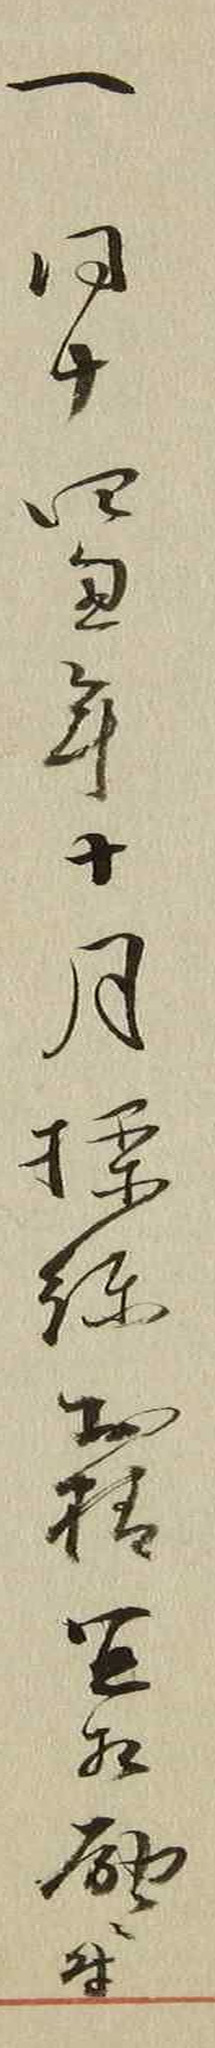一同十四丑年十月操練出精宜相励候ニ付
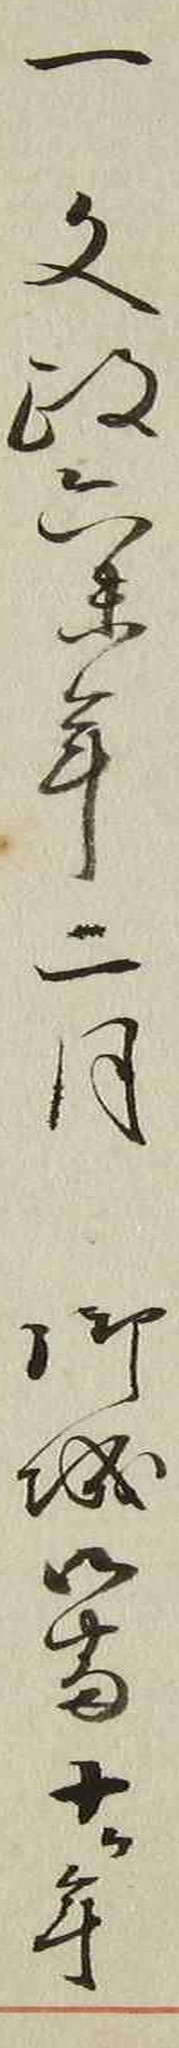一文政六未年二月御城御番十ケ年
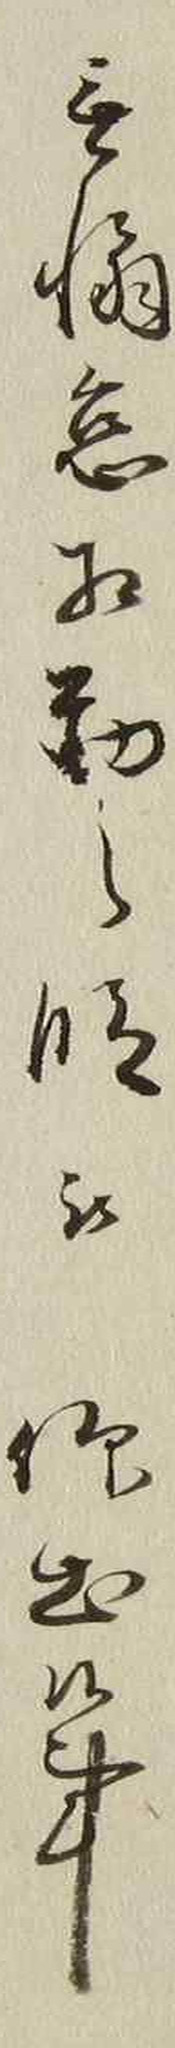無懈怠相勤之段被仰出候事

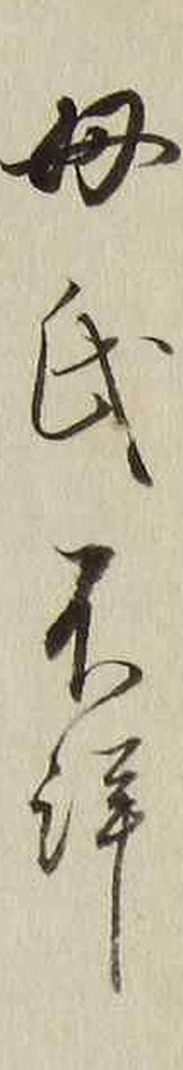母氏不詳
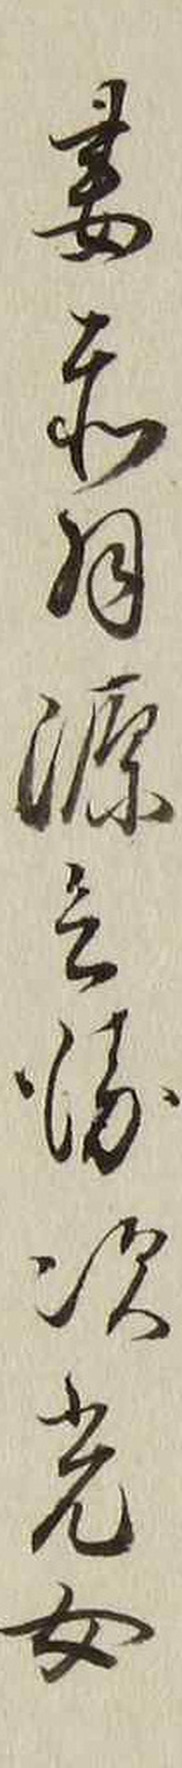妻赤羽源兵衛次光女
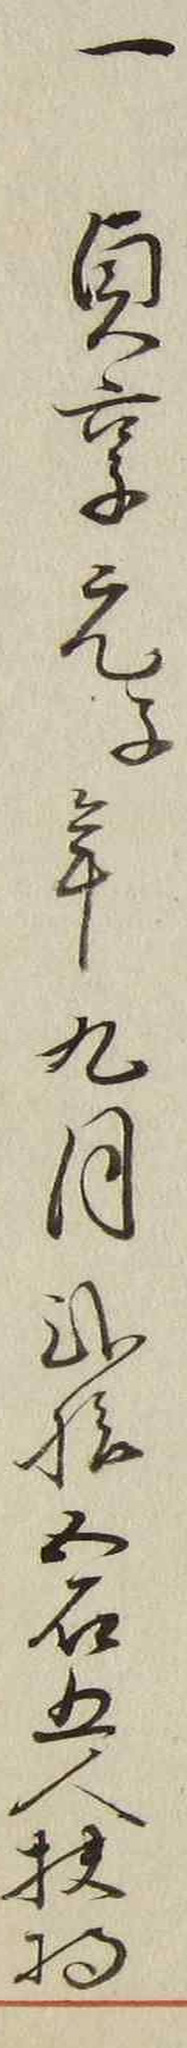一貞享元子年九月弐拾五石五人扶持
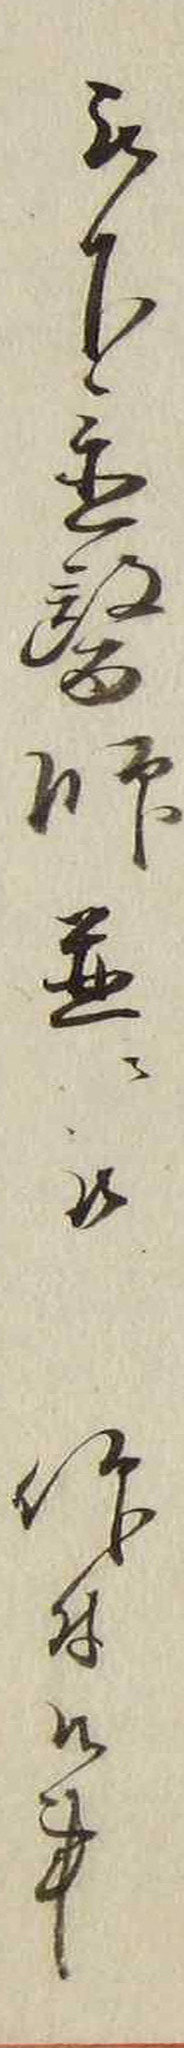被下置医師並ニ被仰付候事

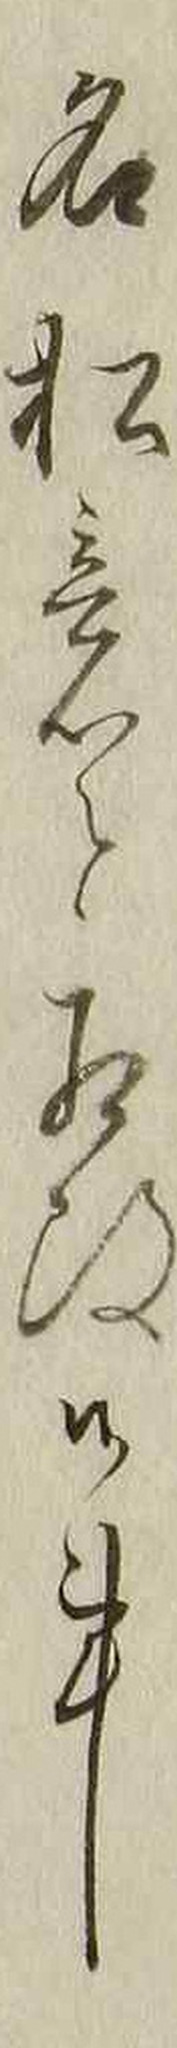名松意と相改候事
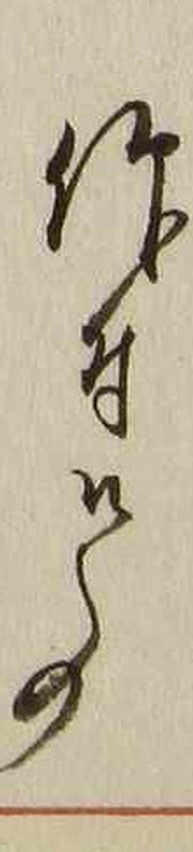仰付候事
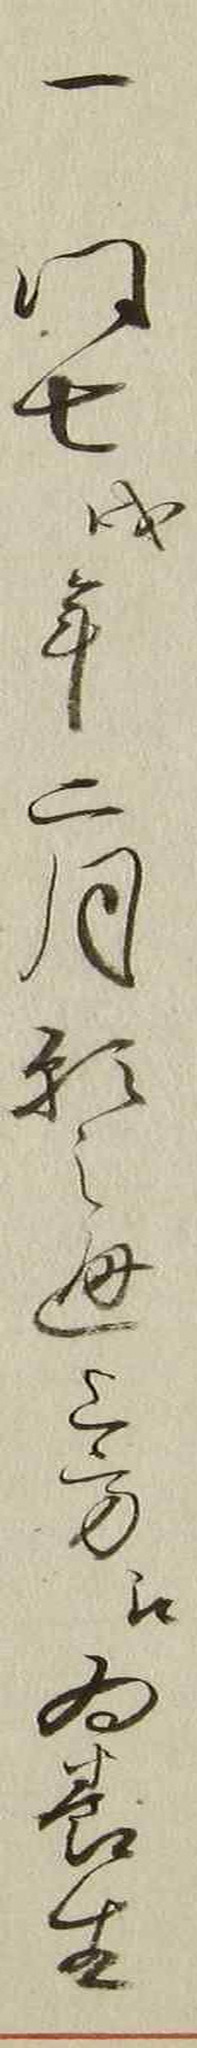一同七戌年二月願之通上方江為養生
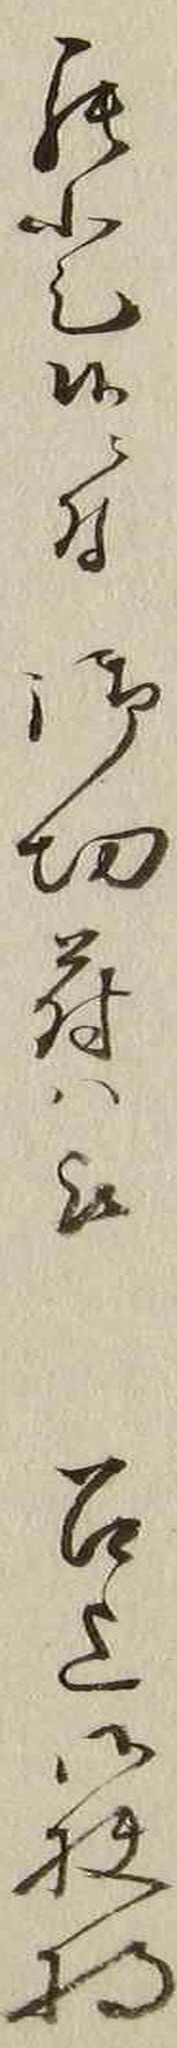罷登候ニ付御切符ハ被召上御扶持
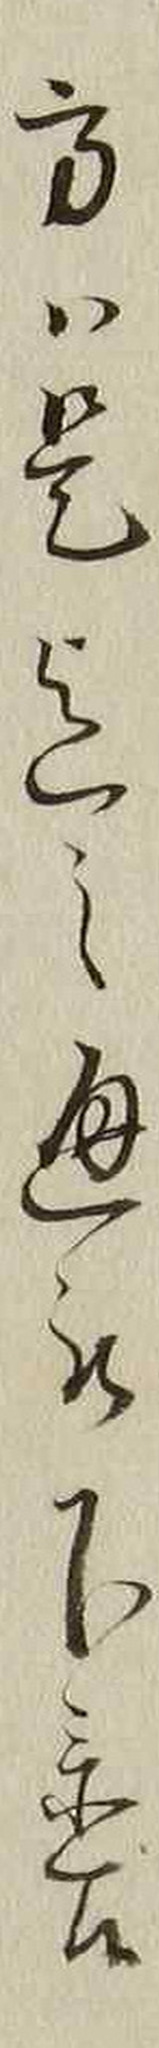方ハ是迄之通被下置候
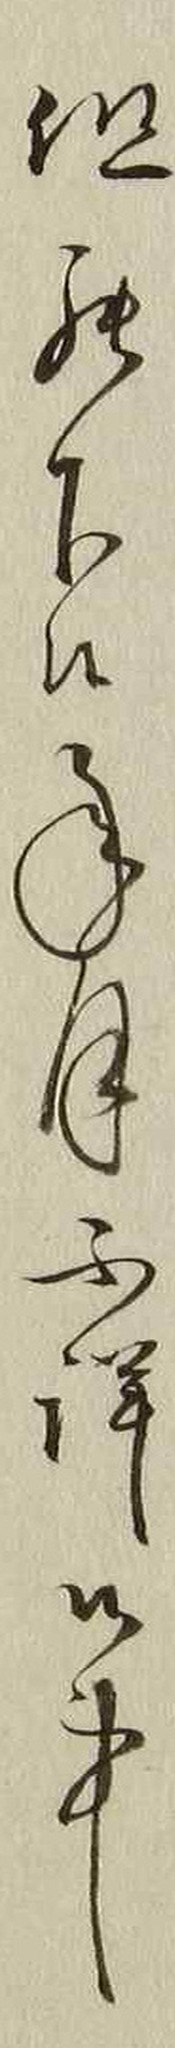但罷下候年月不詳候事
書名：諸士系譜　巻之26　い之部26
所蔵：会津若松市立会津図書館
